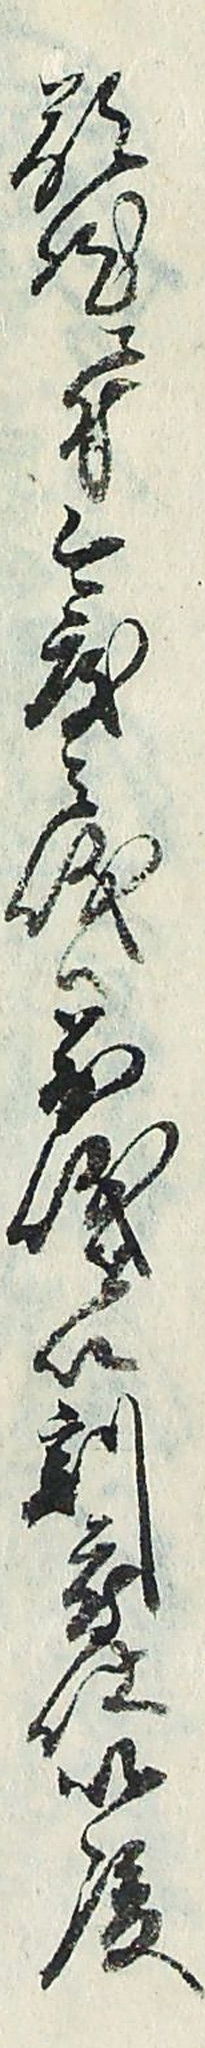顕然に付今度之儀は別儀を以割符仕以後
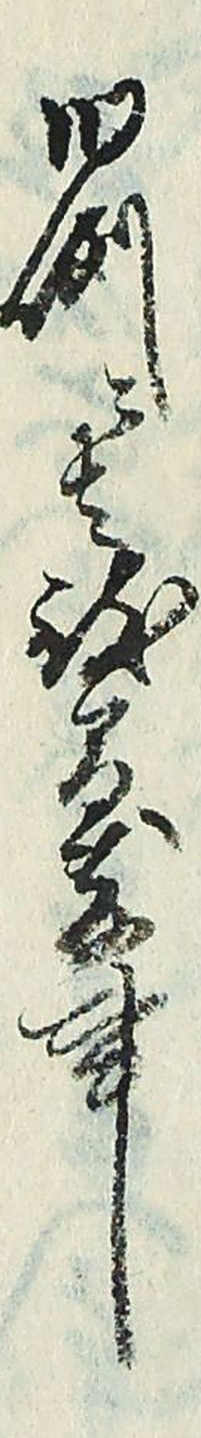旧例には致間敷事
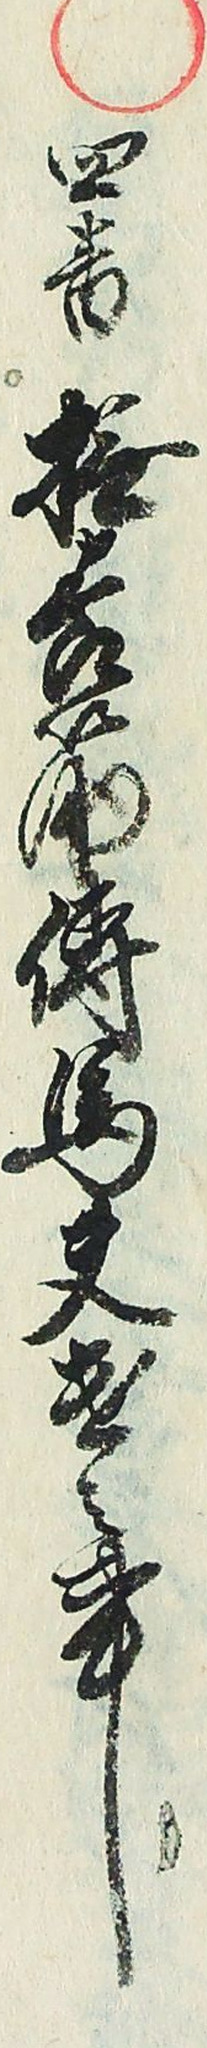四番撫養筋伝馬夫遣之事
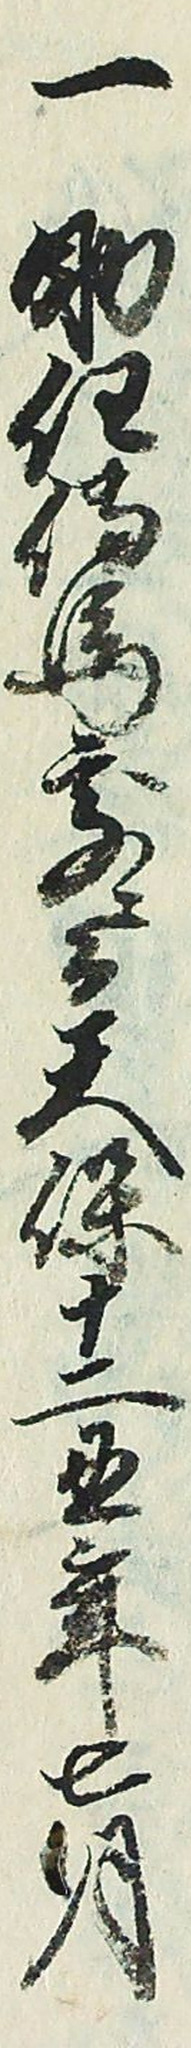一助任伝馬処にて天保十二丑年七月
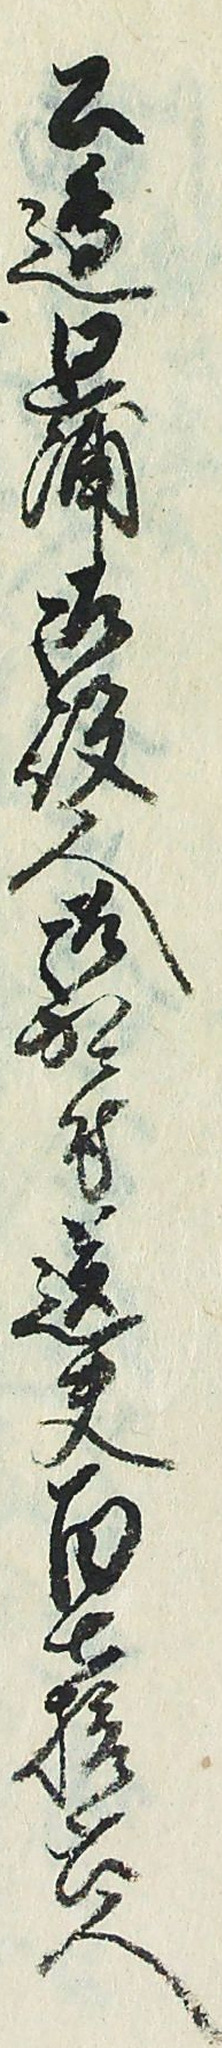公辺廻浦御役人御出に付送夫百七十六人
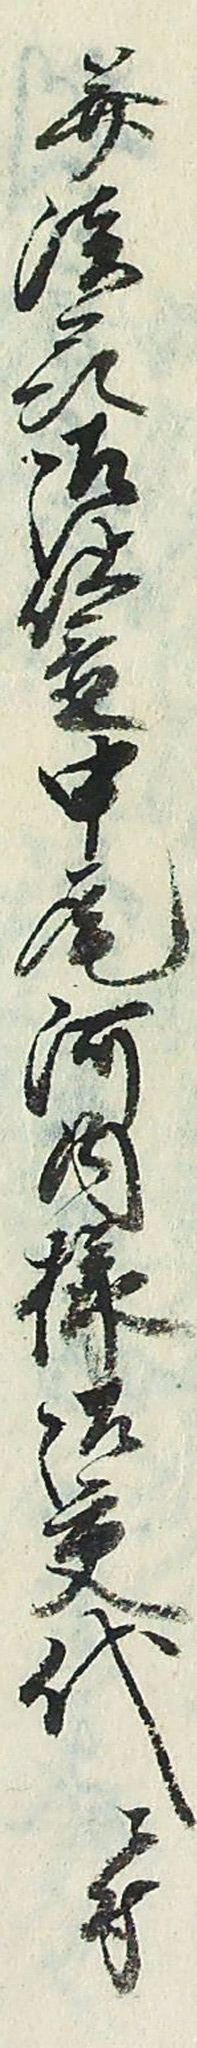并淡州御仕置中尾河内様御交代に付
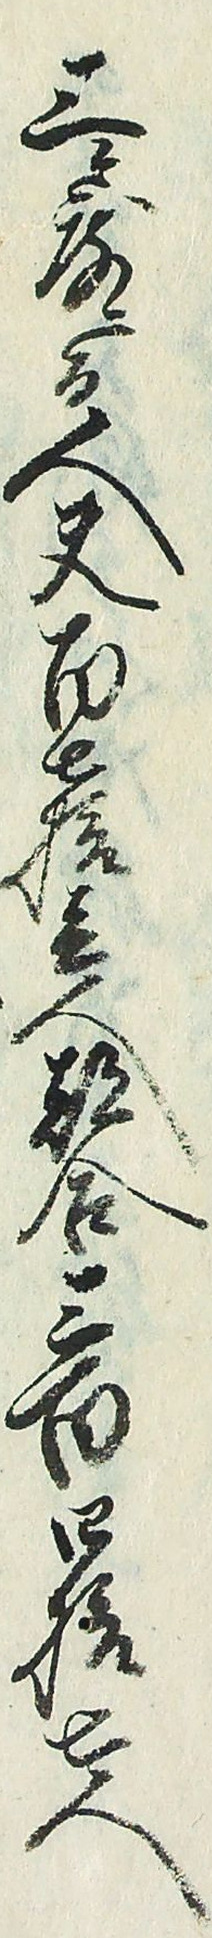三ヶ度にて人夫百七十一人都合三百四十七人
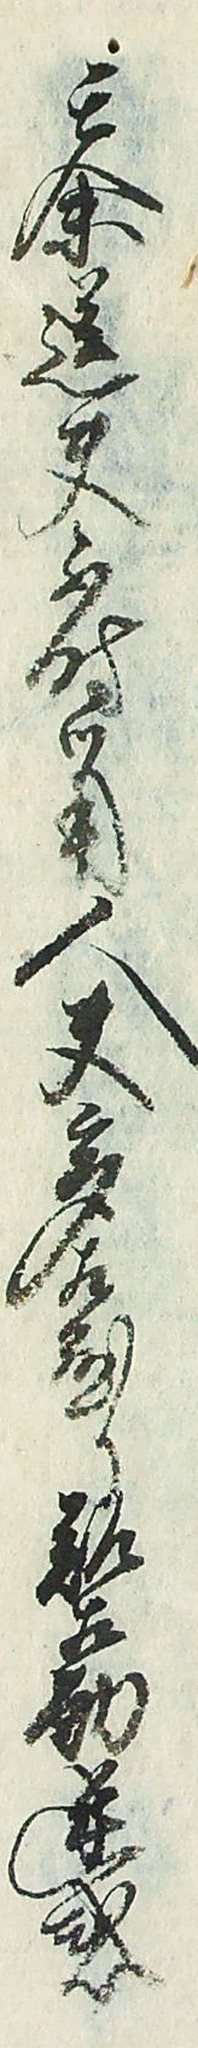其余送夫不時御用人夫多相懸り難相勤迷惑
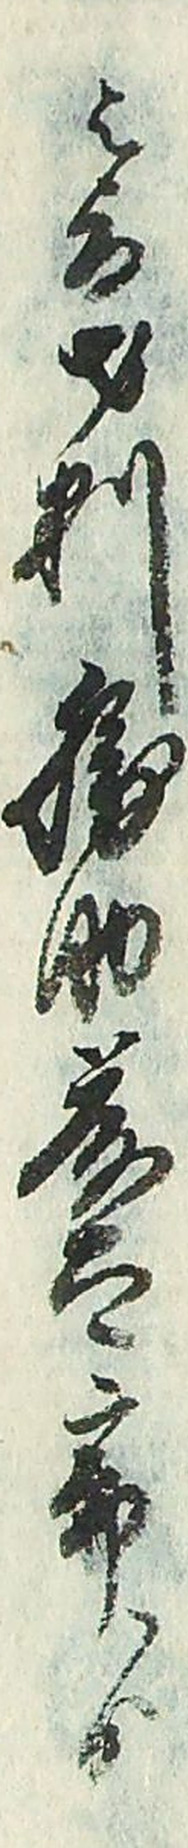之旨才判勝助藤太郎より

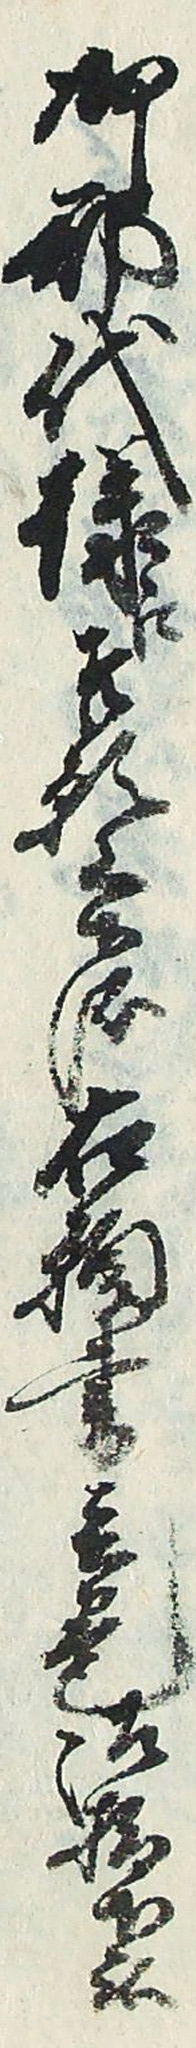御郡代様え奉願上候所右願書一巻御指下被
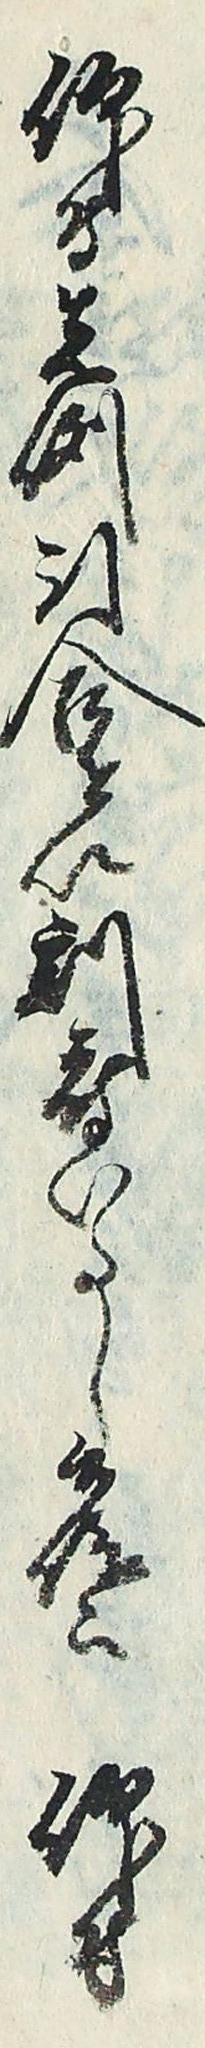仰付先例引合を以割符いたし候様被仰付
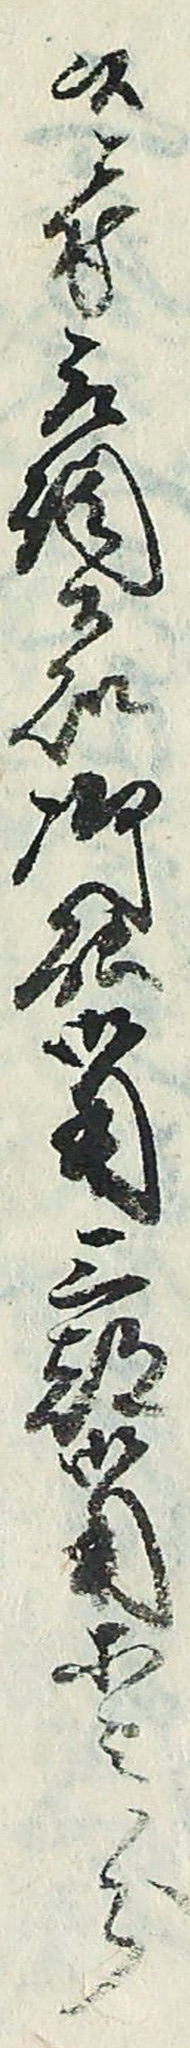候に付取調候処御触御用三郡御用等之分
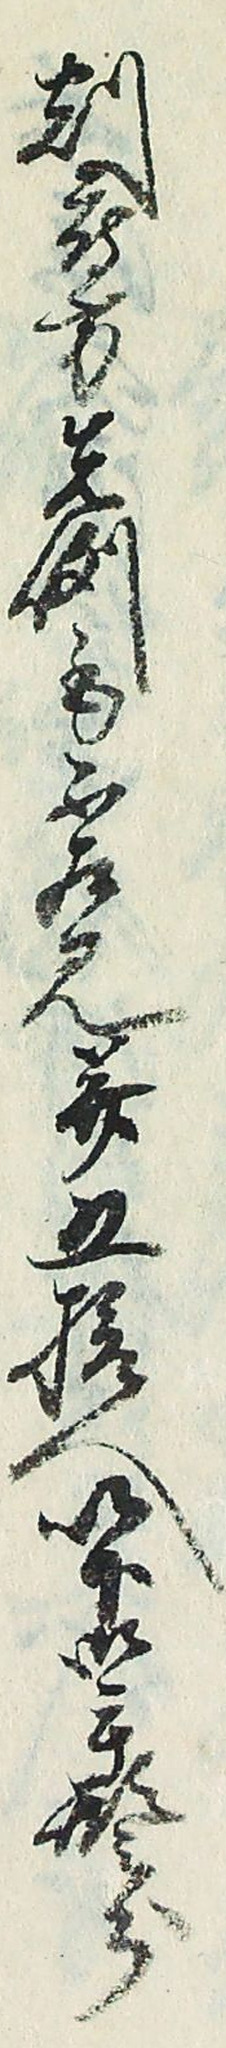割符方先例も不相見并五十人以下御手形之分
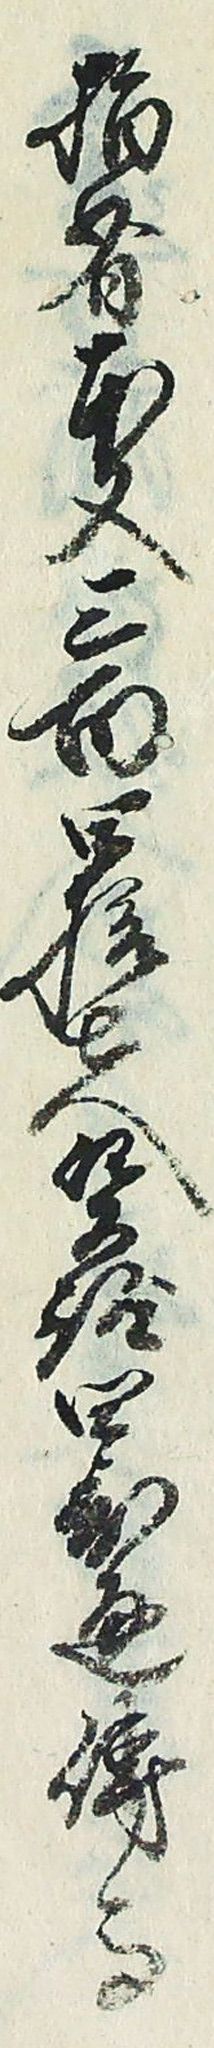指省本文三百四十七人賃銀四歩通伝馬
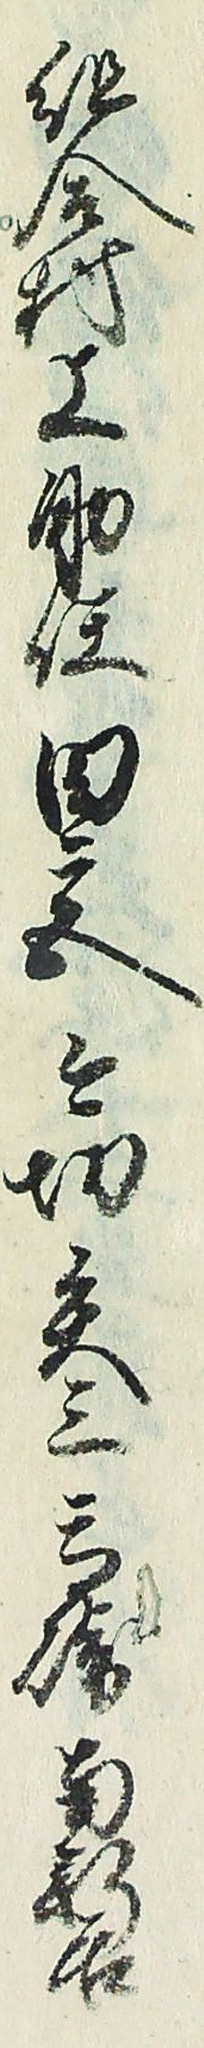組合村上助任田宮今切矢三高崎南新居
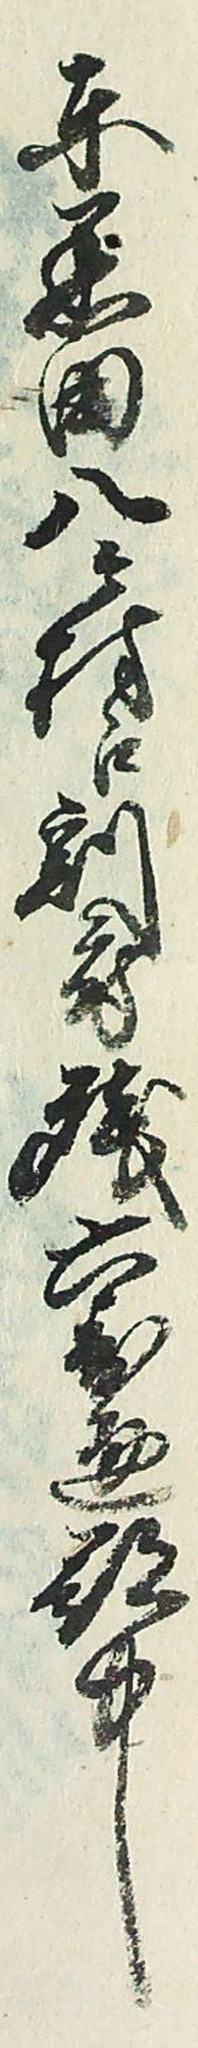東黒田八ヶ村え割符残六歩通郡中
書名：諸割賦物賃銀定記録帳
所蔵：鳴門教育大学 Naruto University of Education
